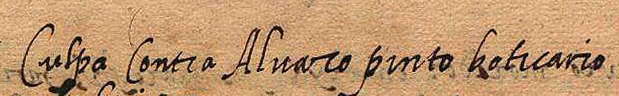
Culpa Contra Aluaro pinto boticairo
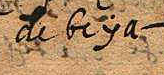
de beya –
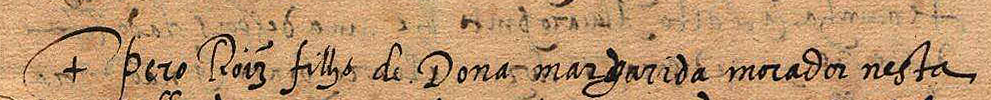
item pero Roiz̄ filho de Dona margarida morador nesta
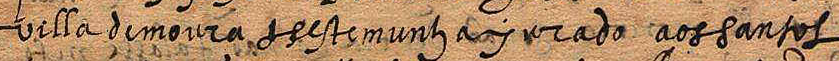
villa de moura teestemunha yurado aos santos
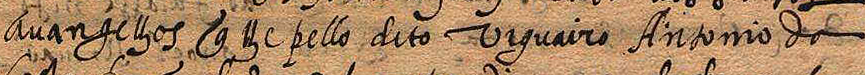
auangelhos q̄ lhe pello dito viguairo Antonio da
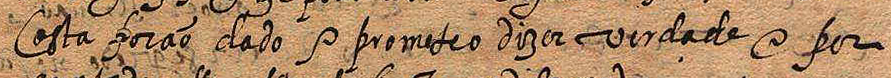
Costa foraõ dado e prometeo dizer verdade e per
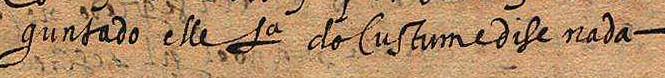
guntado elle ta do Custume e dise nada –
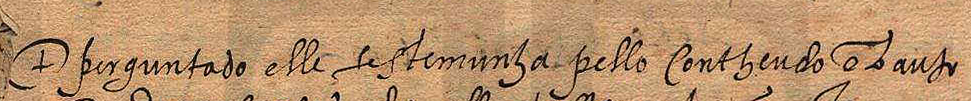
item perguntado elle testemunha pello Contheudo ē o auto
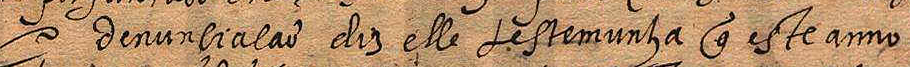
e denunciaçaõ diz elle testemunha q̄ este anno
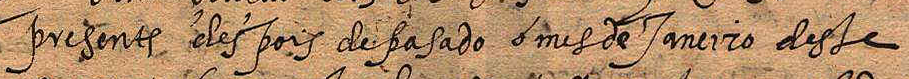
presentꝭ despois de pasado o mes de Janeiro deste
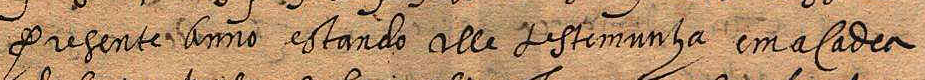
presente anno estando elle testemunha em a Cadea
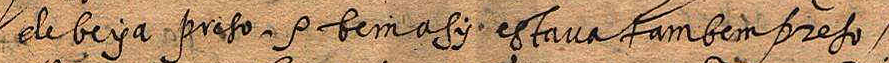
de beya preso, e bem asy estaua tambem preso /
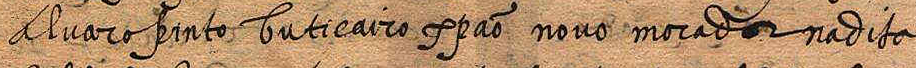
aluaro pinto buticairo xpaõ nouo morador na dita
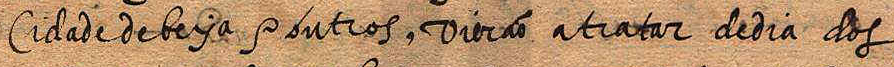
Cidade de beya e outros, vieraõ a tratar de dia dos
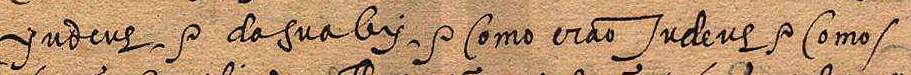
yudeus, e da sua ley, e Como eraõ Judeus e Como/
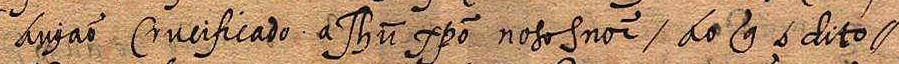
aujaõ Crucificado a Jhū xpō noso snor̄ / ao q̄ o dito //
